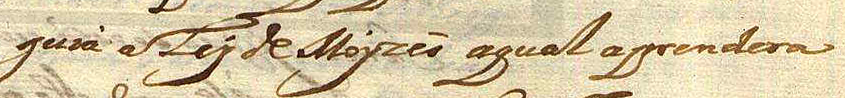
guia a Ley de Moyzés a qual aprendera
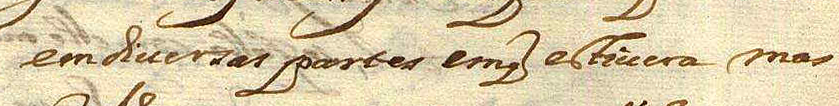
em diuersas partes em q̄ estiuera mas
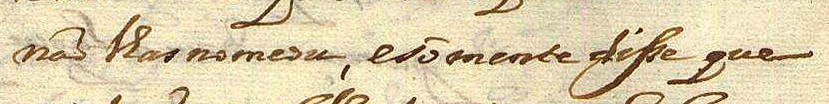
naõ lhas nomeou, e sómente disse que
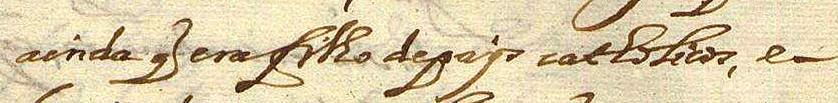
ainda q̄ era filho de pays catholicos, e
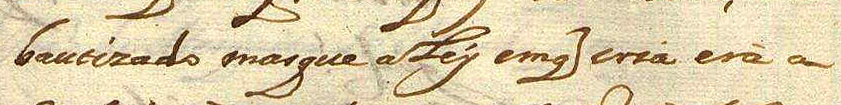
bautizado mas que a Ley em q̄ cria era a
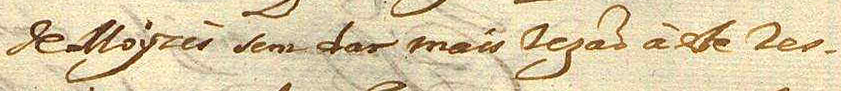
de Moyzés sem dar mais Rezaõ à este Res
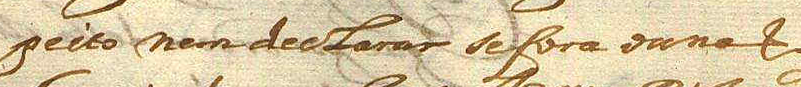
peito nem declarar se fora ou naõ
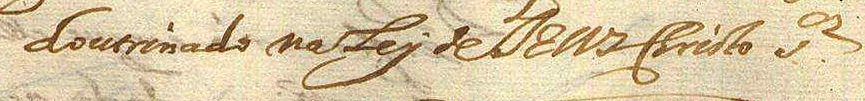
doutrinado na Ley de IESVS Christo sor
